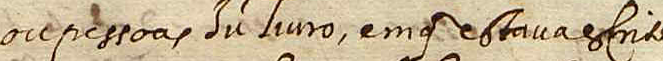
ou pessoas hū liuro, em q̄ estaua esCrito
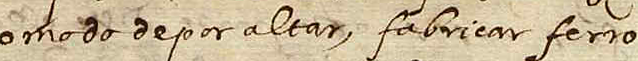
o modo de por altar, fabricar ferro
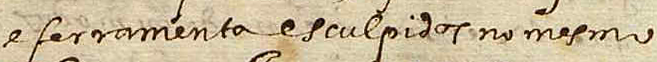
e ferramenta esculpidos no mesmo
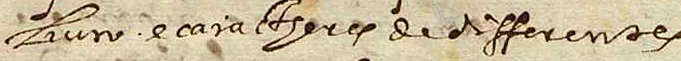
Liuro, e caractheres de differentes
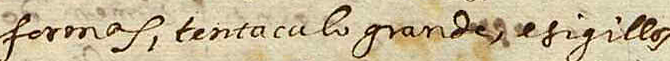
formas, tentaculo grande, e sigillos
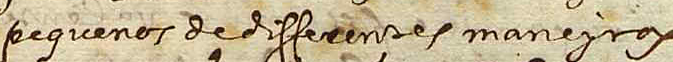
pequenos de differentes maneyras
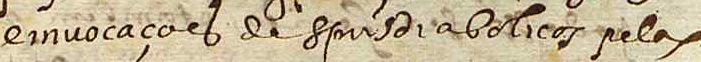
e invocaçoẽs de spūs diabolicos pelas
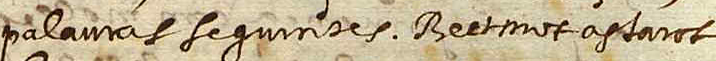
palauras seguintes. Beetmot astarot
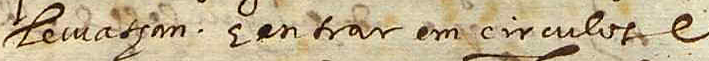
Leuiatham. E entrar em circulos e
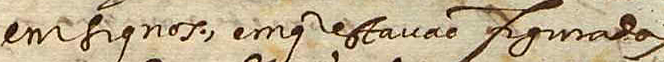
em signos, em q̄ estauaõ figuradas
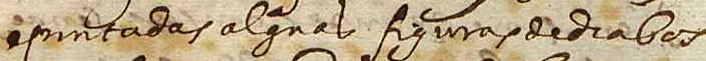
e pintadas alguas̄ figuras de diabos
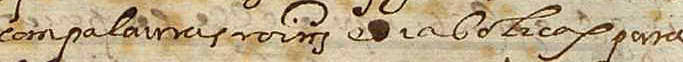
com palauras roīns e diabolicas para
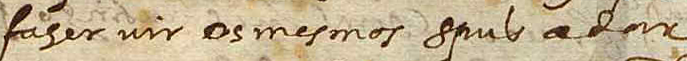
fazer uir os mesmos spus̄ a dar
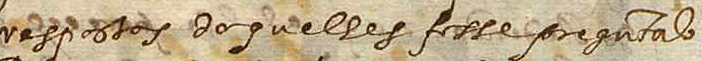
respostas do que lhes fosse pregūtado
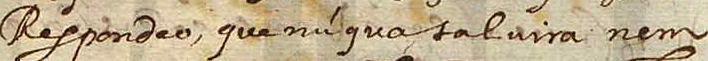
Respondeo, que nūqua tal uira nem
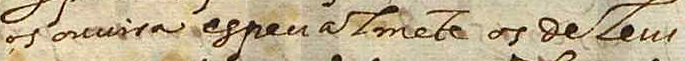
os ouuira especialmēte os de Leui
